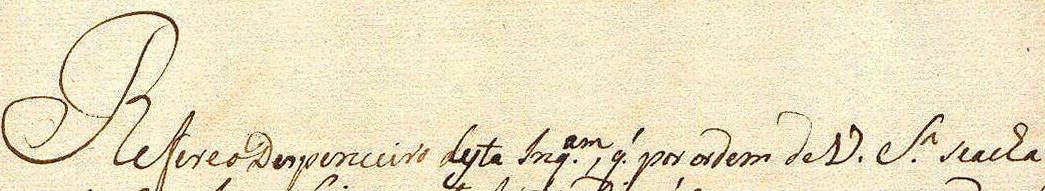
Refere o Despenceiro desta Inq.am q̄ por ordem de V. S.a se acha
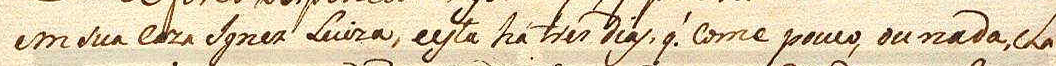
em sua caza Ignez Luiza, e esta há tres dias, q̄ come pouco, ou nada, cLa
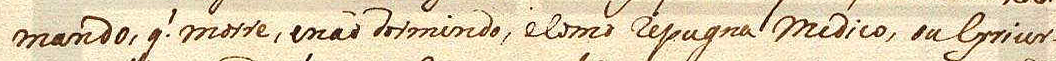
mando, q̄ morre, e naõ dormindo, e como Repugna medico, ou Cyriur
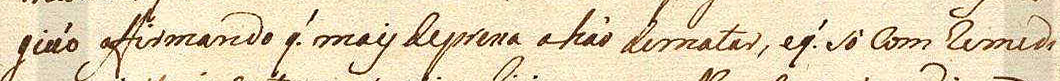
gião affirmando q̄ mais depressa a haõ de matar, e q̄ só com Remedi
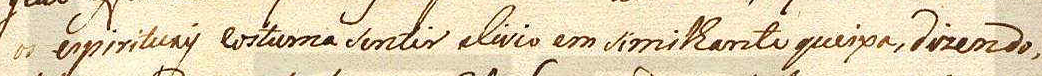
os espirituais costuma sentir alivio em similhante queixa, dizendo,
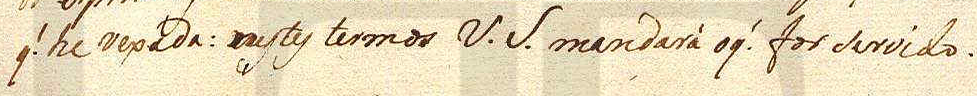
q̄ he vexada: nestes termos V. S. mandará o q̄ for servido.
